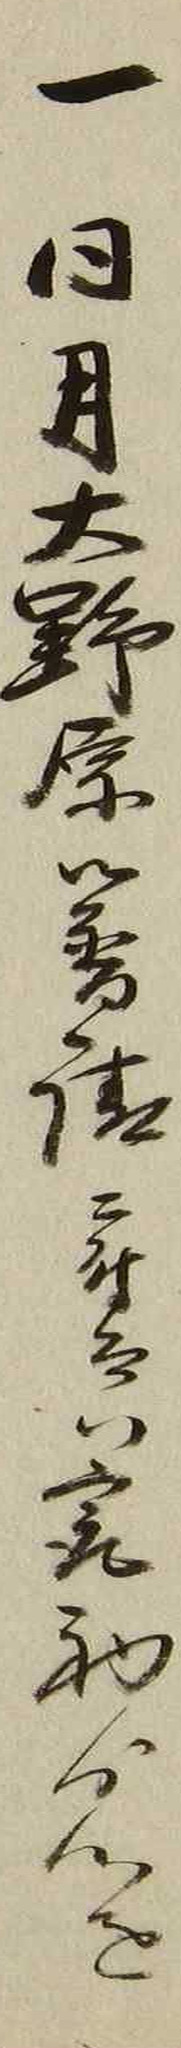一同月大野原御普請ニ付而ハ最初ゟ心を
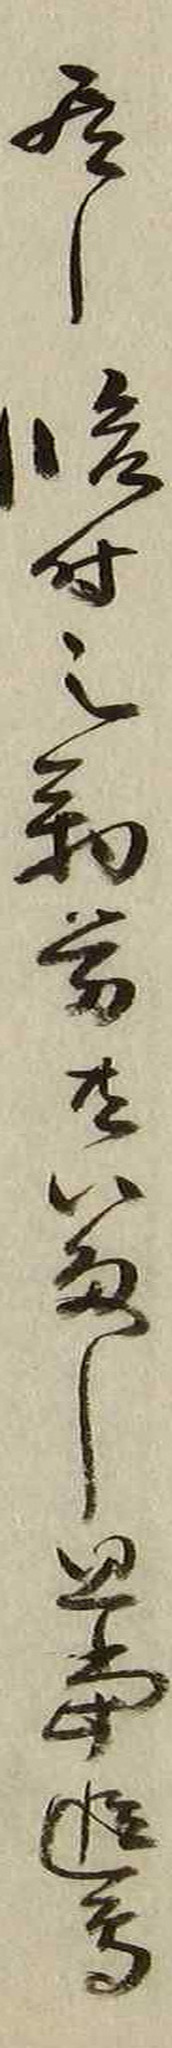尽し臨時之勤労共いたし且当追鳥
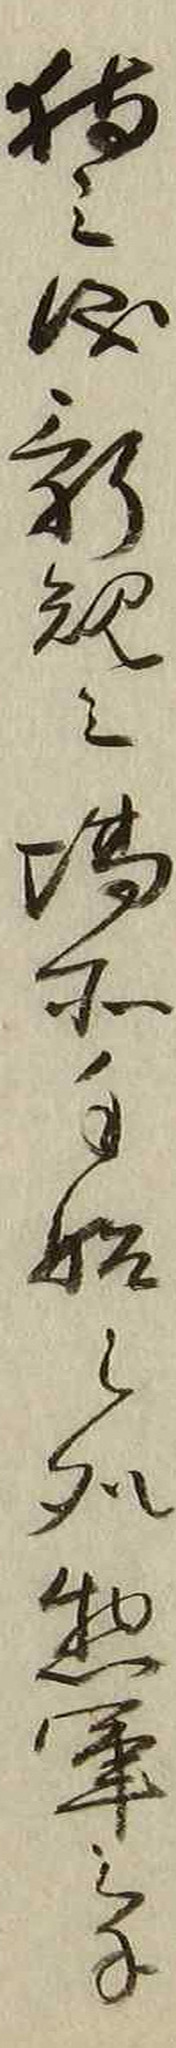狩之儀新規之場所手始之処惣軍之手
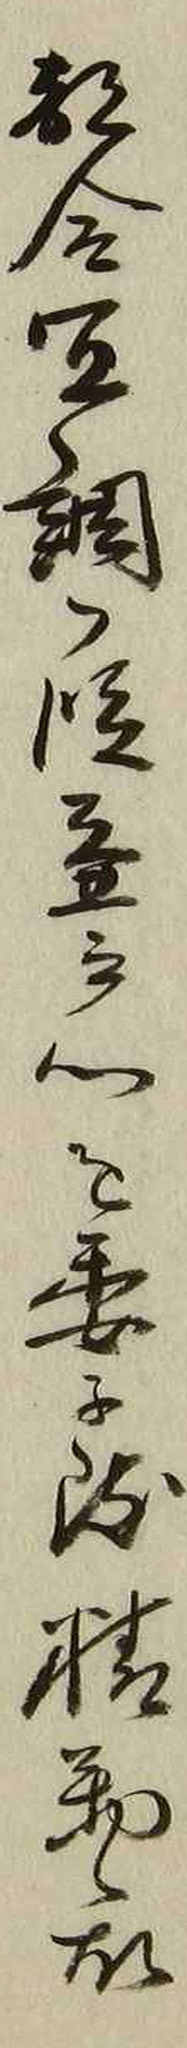都合宜調候段兼而心を委ね致精勤候故
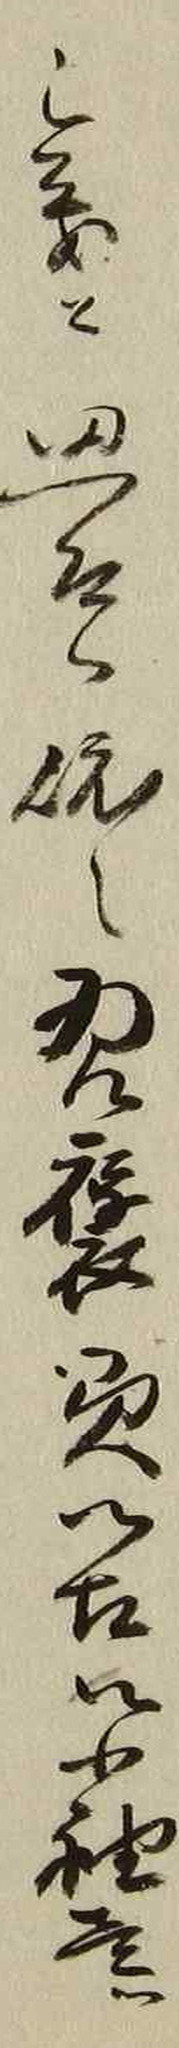之義と思召候依之為御褒美御古御小袖壱ツ
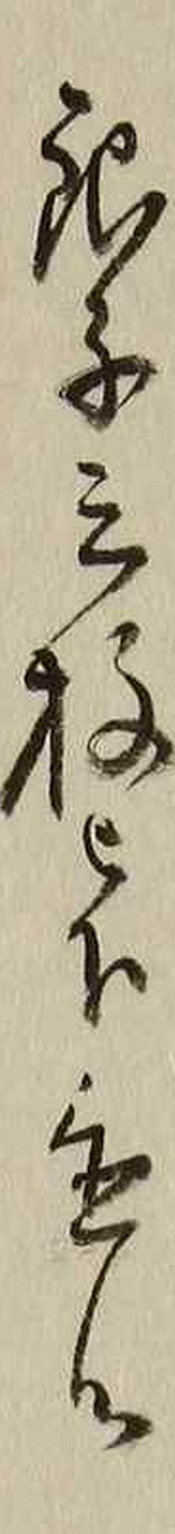銀子三枚被下置候
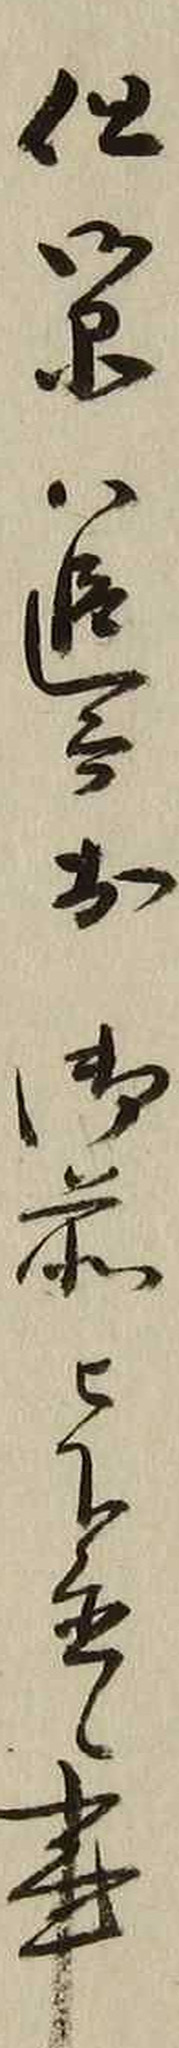但御品ハは追而於御前被下置候事
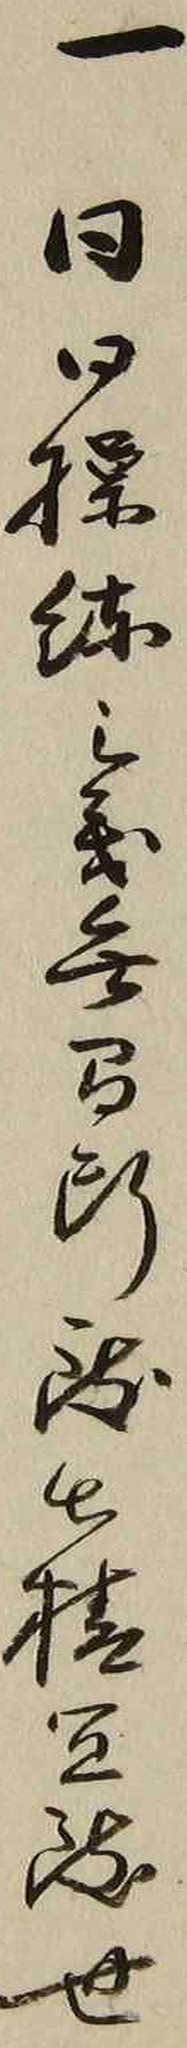一同日操練之義無間断致出精宜致世
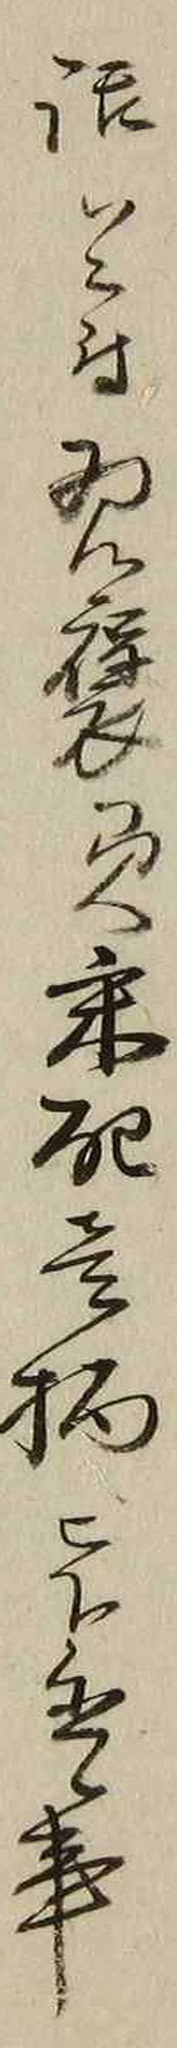話候ニ付為御褒美采配壱柄被下置候事
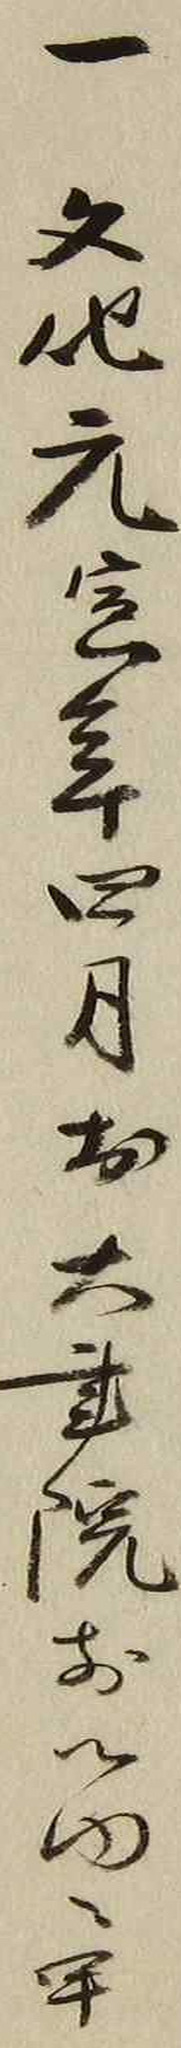一文化元寅年四月於大書院前御内々甲
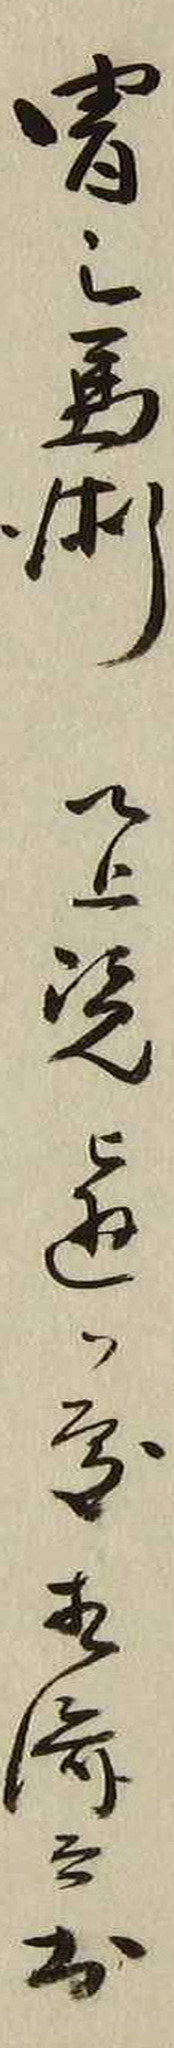冑之馬術御上覧被遊候処相済而於
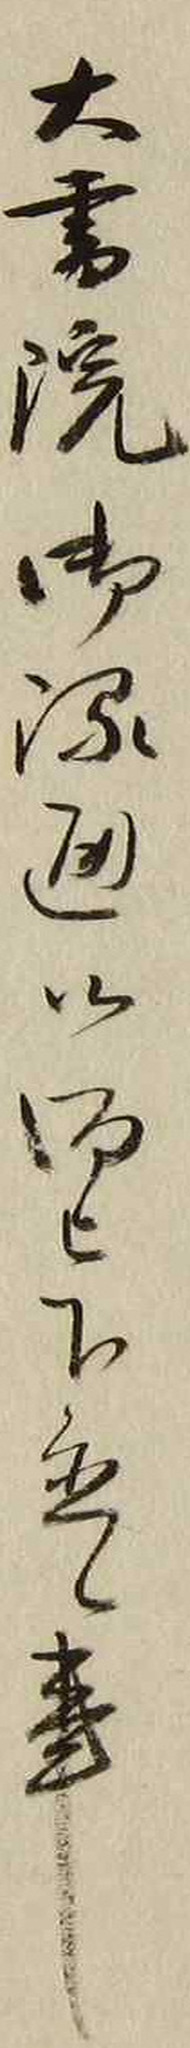大書院御流通御酒被下置候事
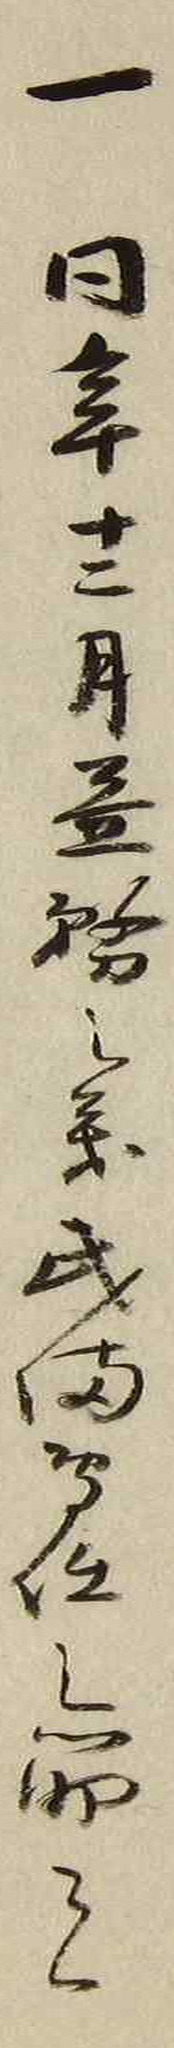一同年十二月兼務之義武備守任之筋ニ候
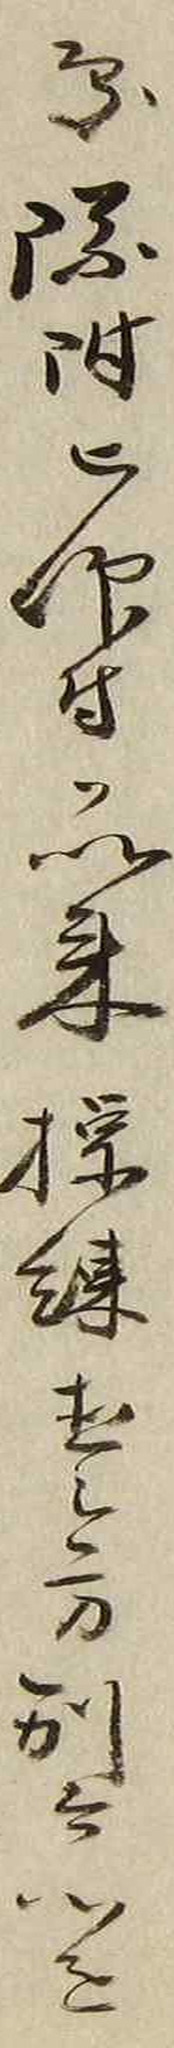処隊附被仰付候以来操練直シ方別而心を
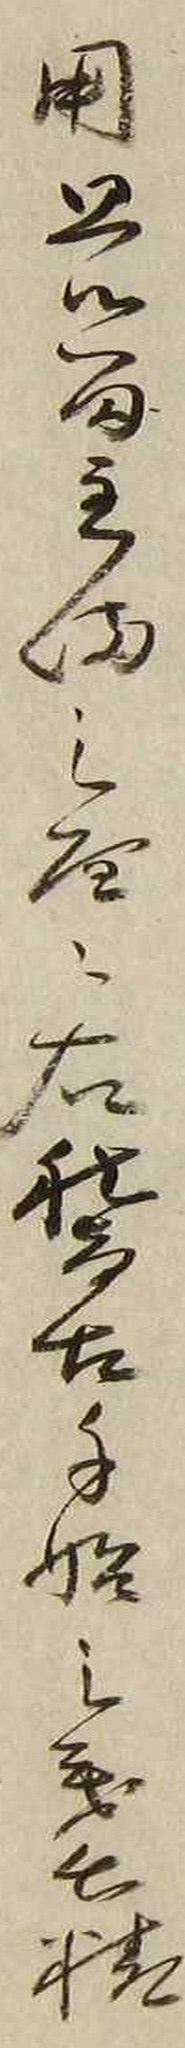用且御留主備之面々右稽古手始之義出精
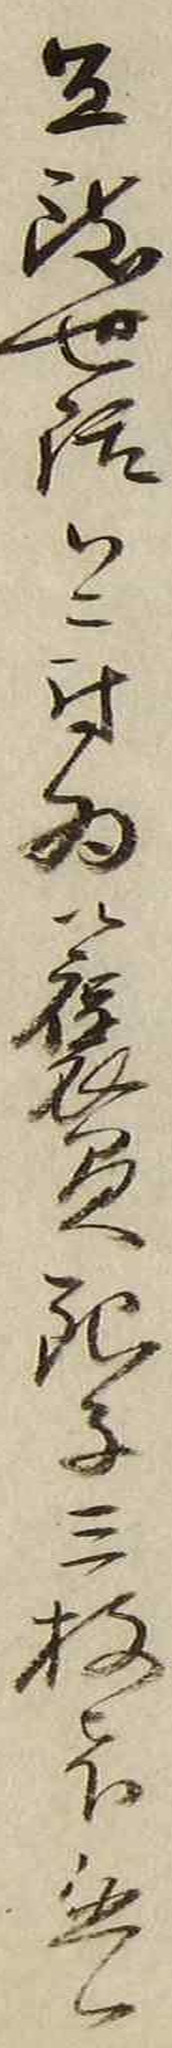宜致世話候ニ付為御褒美銀子三枚被下置候
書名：諸士系譜　巻之311　し之部1
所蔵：会津若松市立会津図書館
